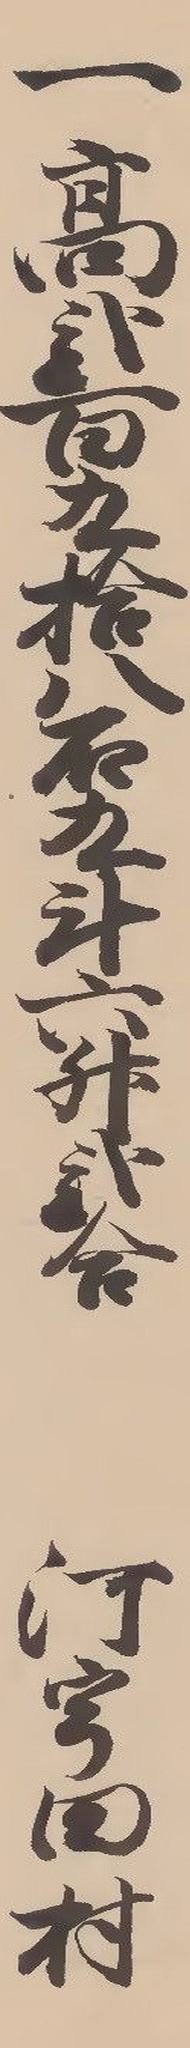一高弐百九拾八石九斗六升弐合河宇田村
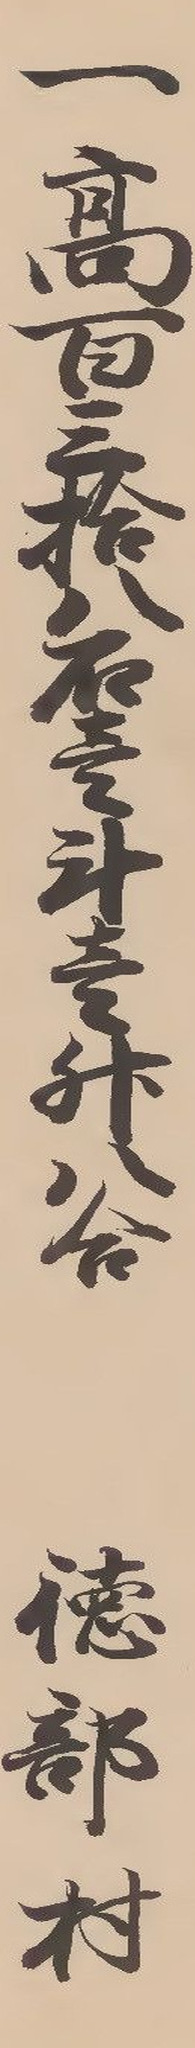一高百三拾八石壱斗壱升八合徳部村
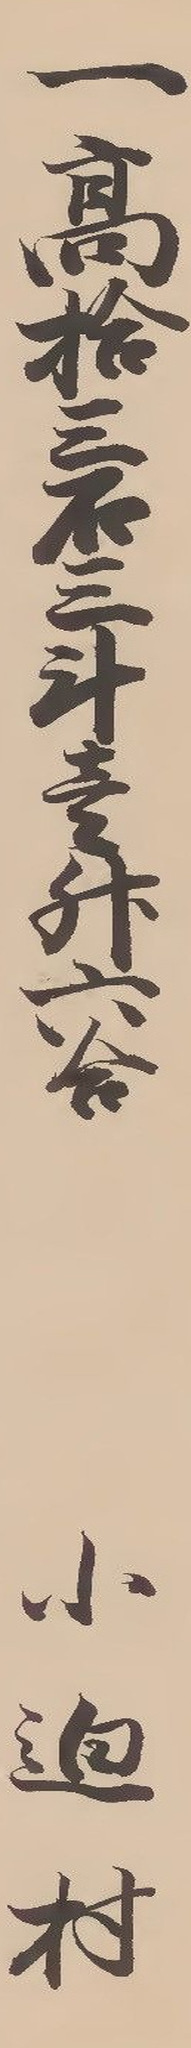一高拾三石三斗壱升六合小迫村
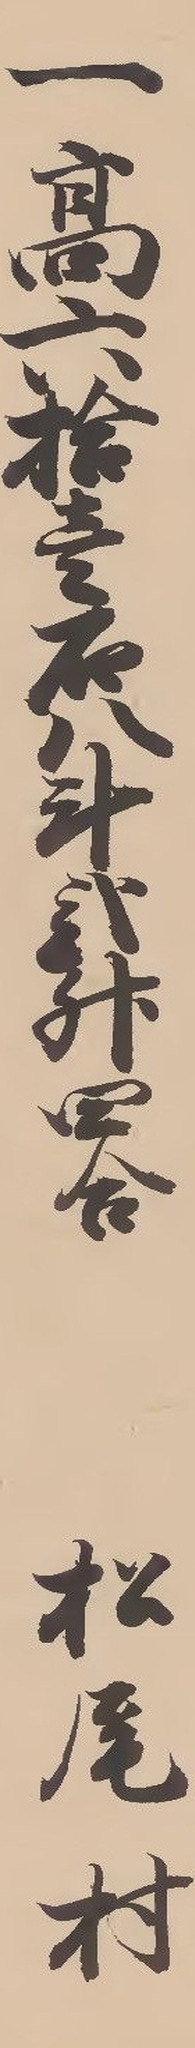一高六拾壱石八斗弐升四合松尾村
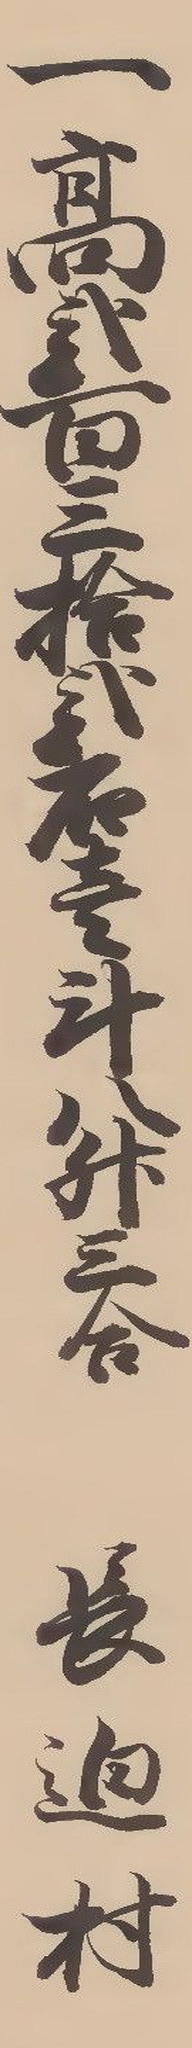一高弐百三拾弐石壱斗八升三合長迫村
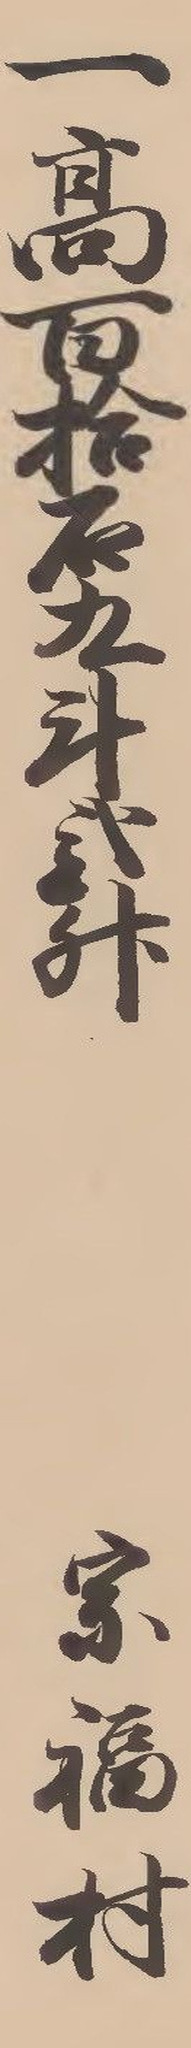一高百拾石九斗弐升宗福村
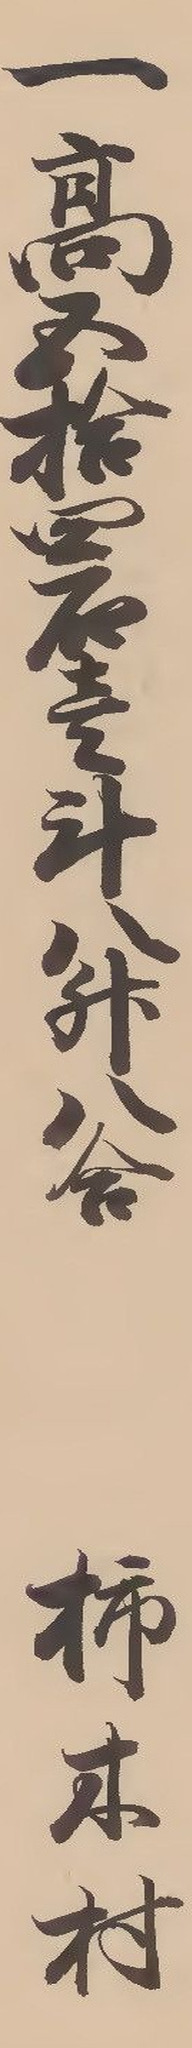一高五拾四石壱斗八升八合柿木村

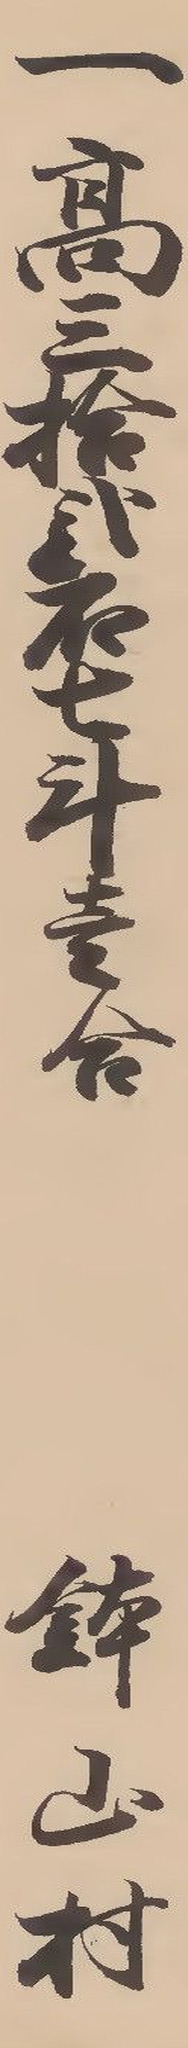一高三拾弐石七斗壱合鉢山村
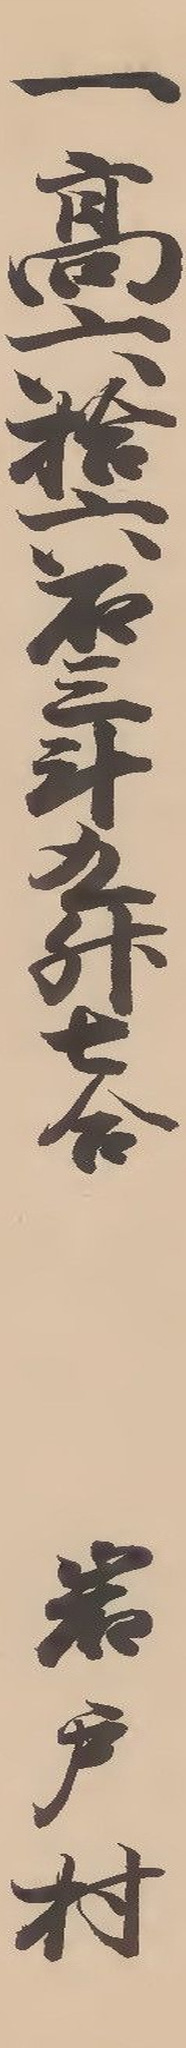一高六拾六石三斗九升七合岩戸村
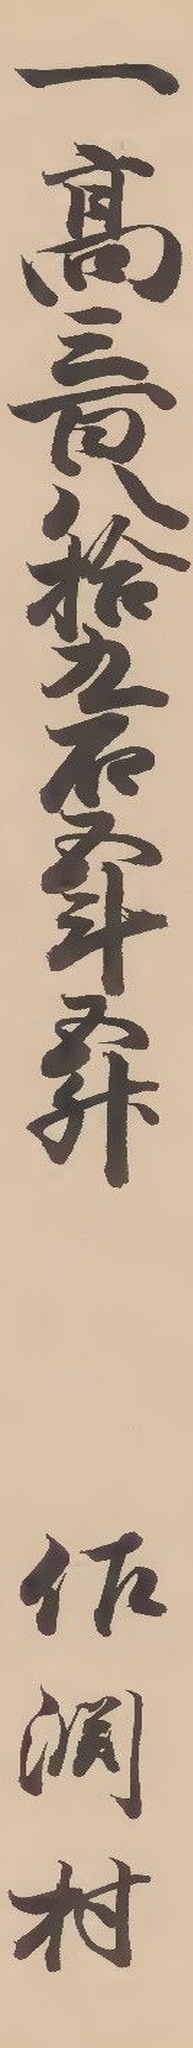一高三百八拾九石五斗五升佐渕村
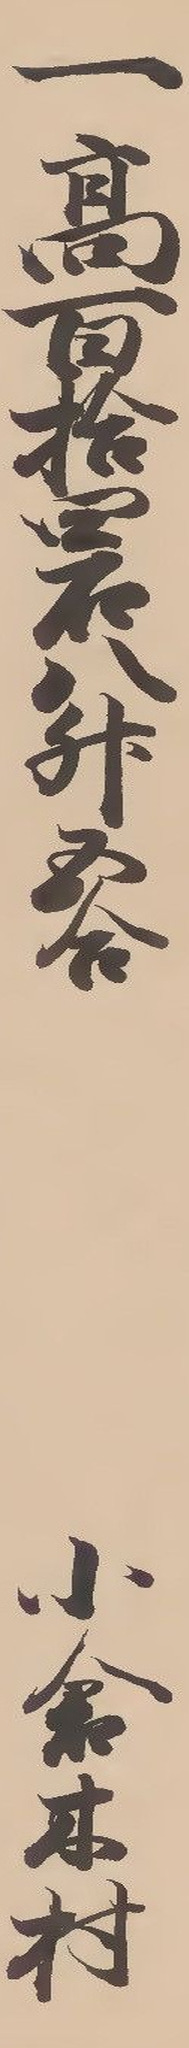一高百拾四石八升五合小倉木村
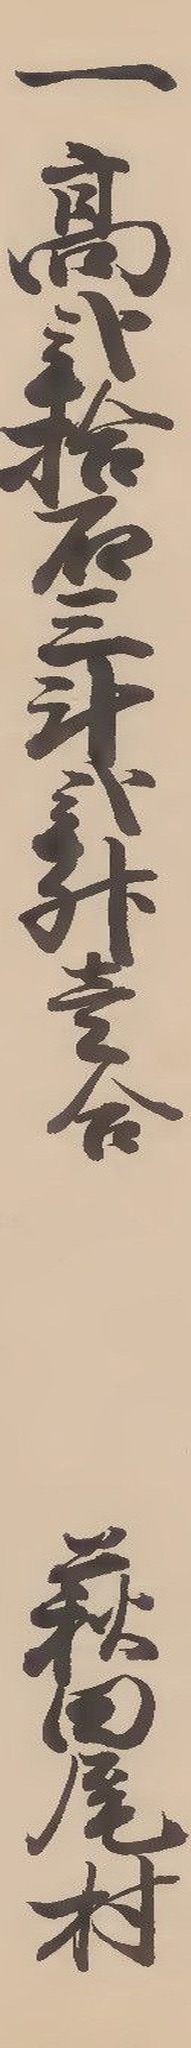一高弐拾石三斗弐升壱合萩田尾村
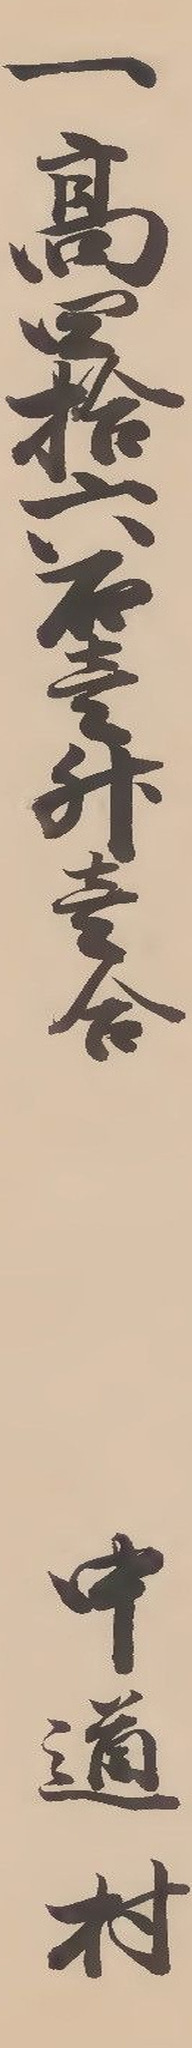一高四拾六石壱升壱合中道村
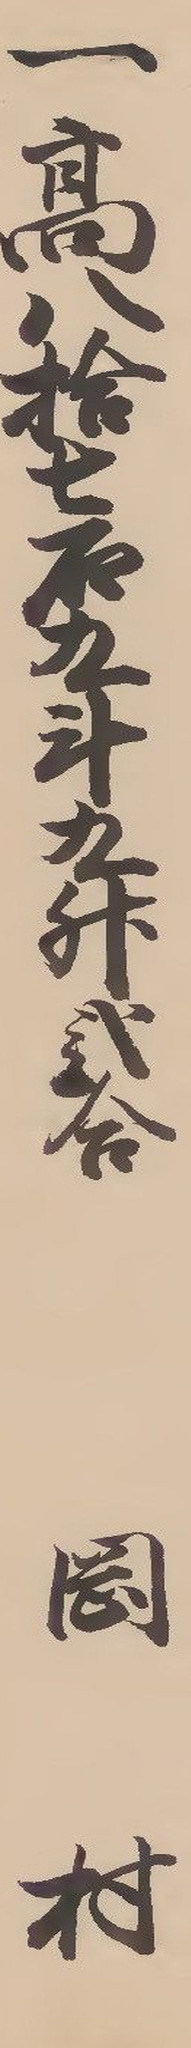一高八拾七石九斗九升弐合岡村

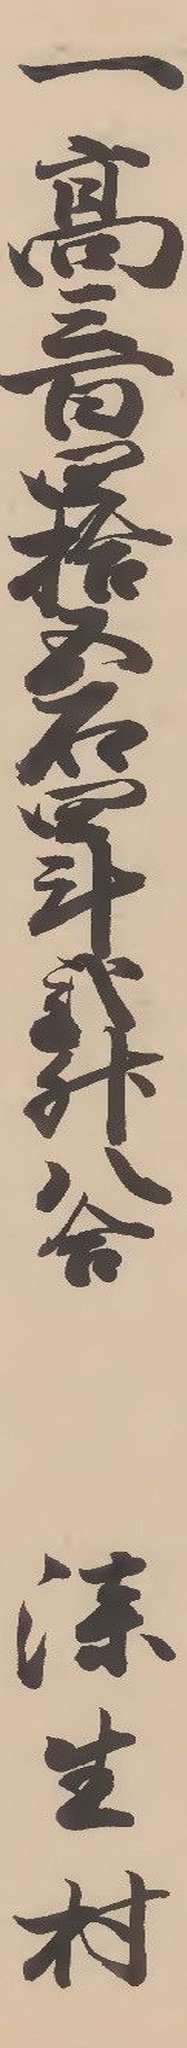一高三百四拾五石四斗弐升八合漆生村
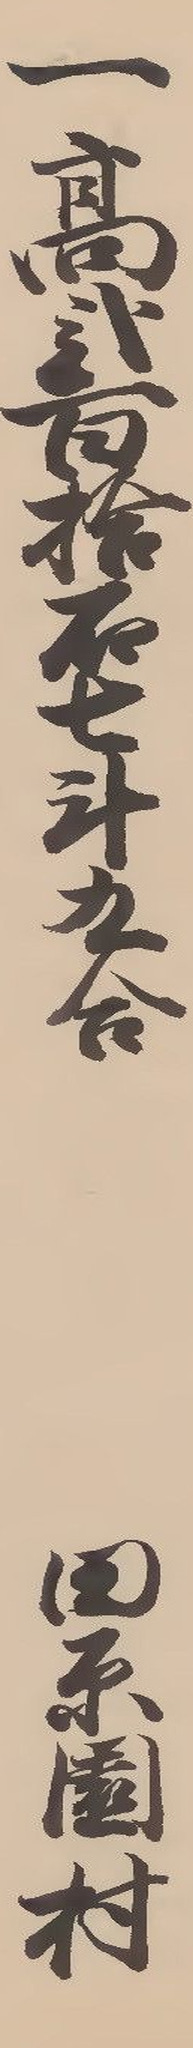一高弐百拾石七斗九合田原園村
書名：豊後国郷帳
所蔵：国立公文書館 National Archives of Japan
